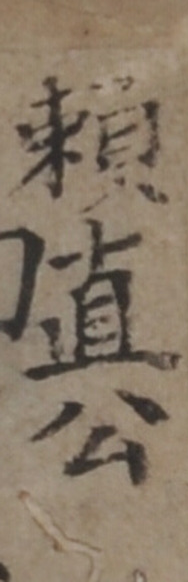頼直公

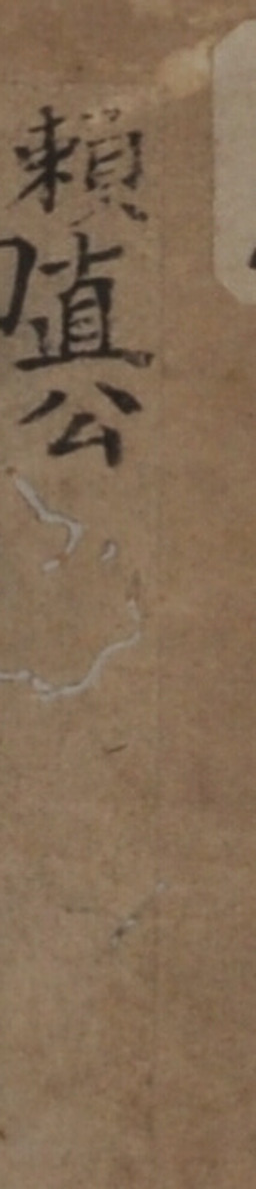頼直公
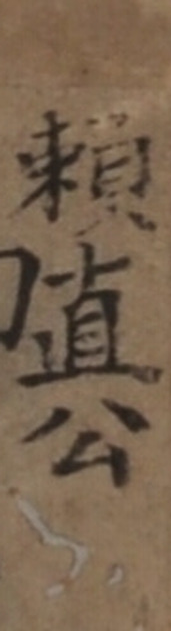頼直公
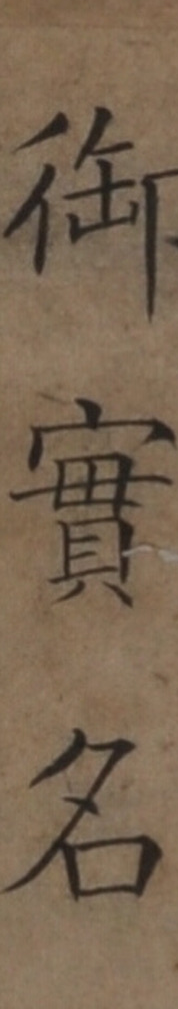御實名
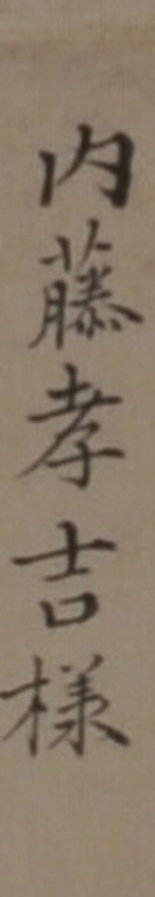内藤孝吉様
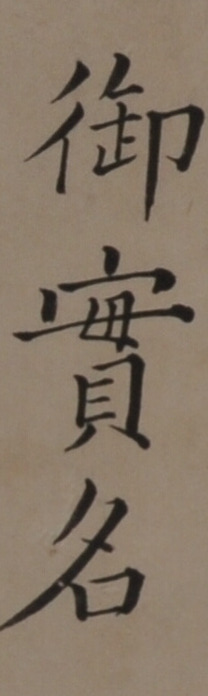御實名

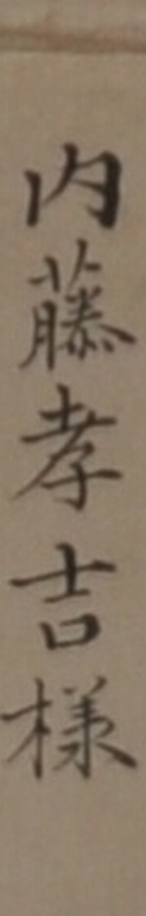内藤孝吉様

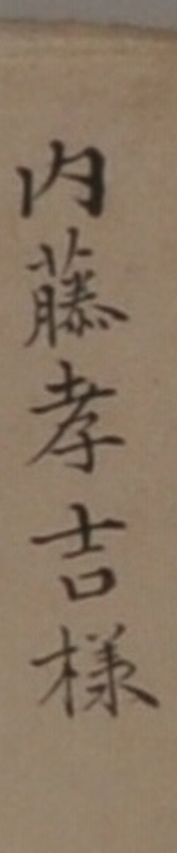内藤孝吉様
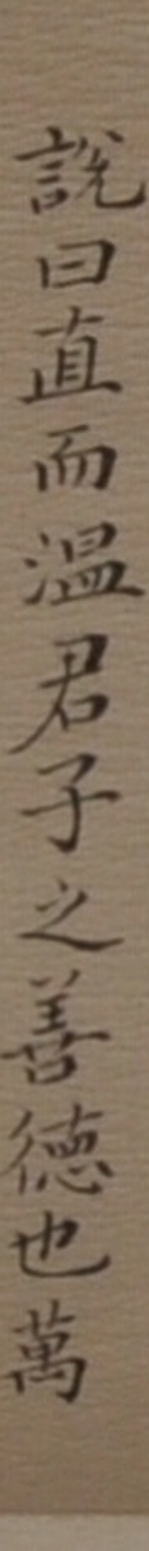説曰直而温君子之善徳也万
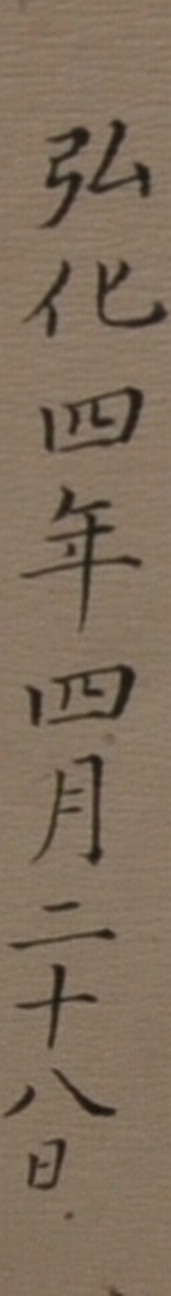弘化四年四月二十八日

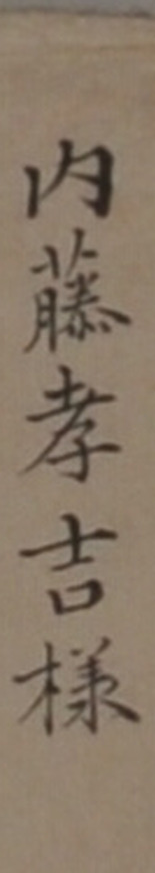内藤孝吉様

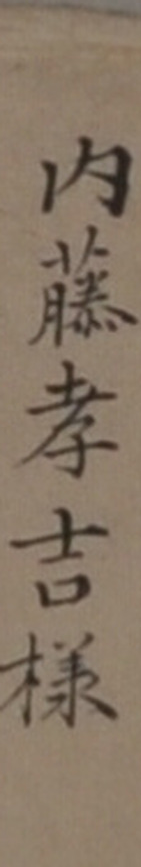内藤孝吉様

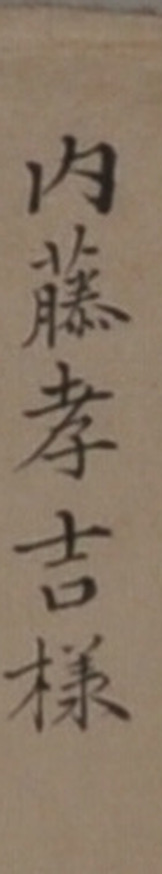内藤孝吉様
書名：御実名
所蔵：伊那市立高遠町図書館・合同会社AMANE
